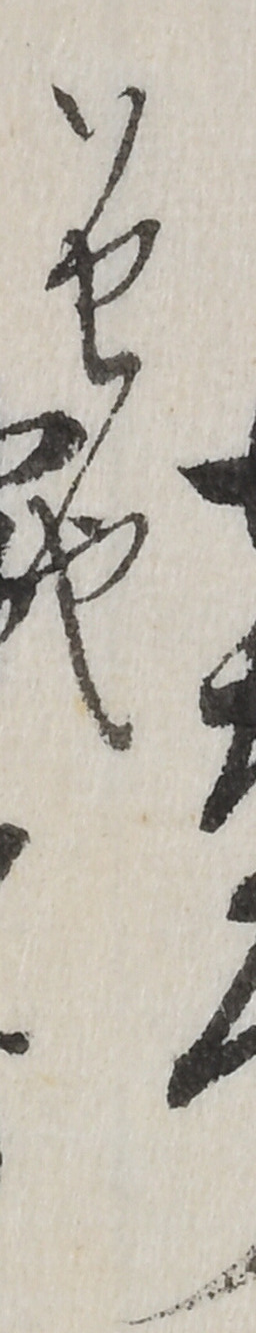いせや
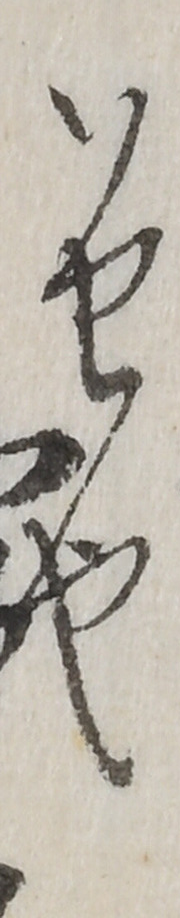いせや
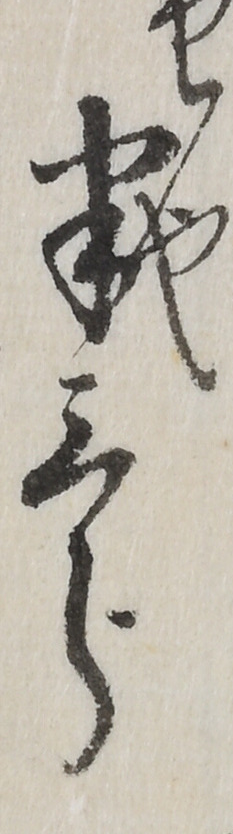半三郎
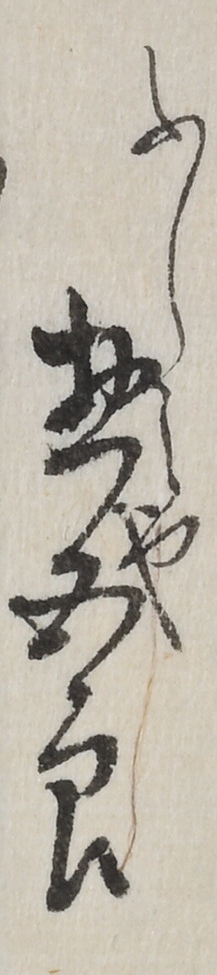惣五郎
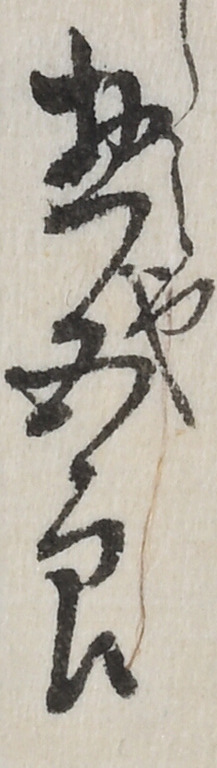惣五郎
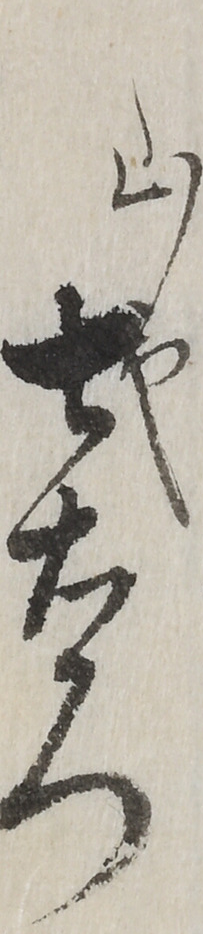七右衛門
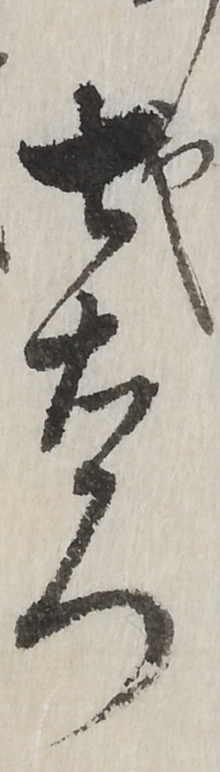七右衛門
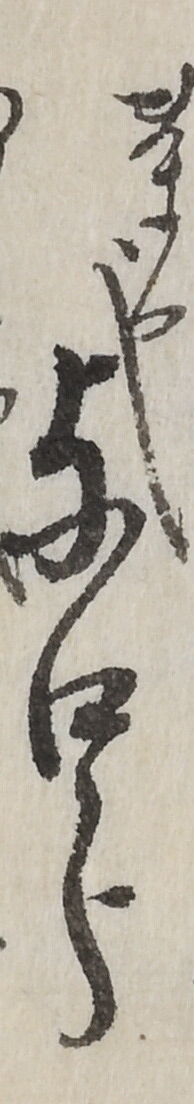与四郎

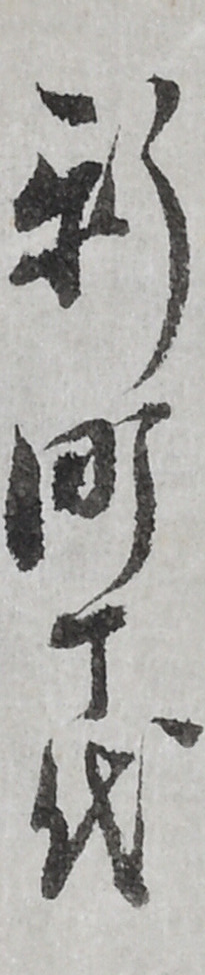新町丁代
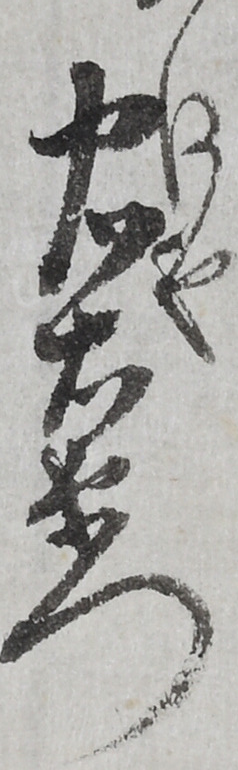忠右衛門
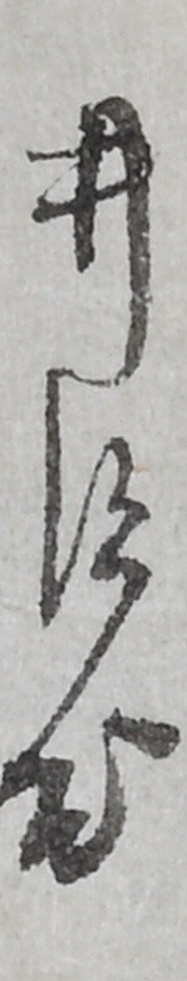井沢屋
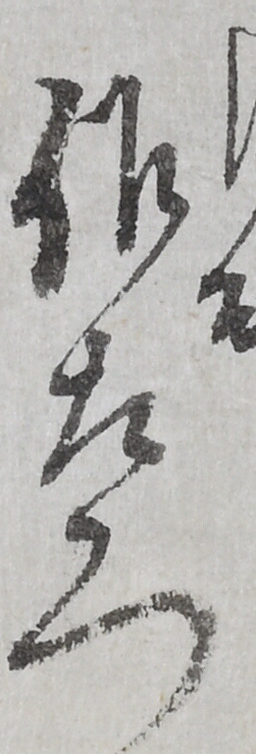作左衛門
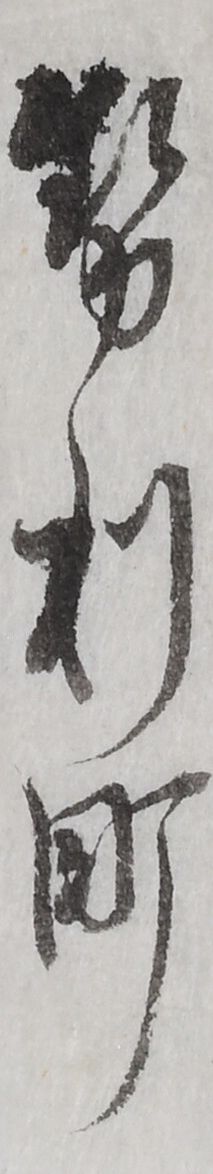勢利町
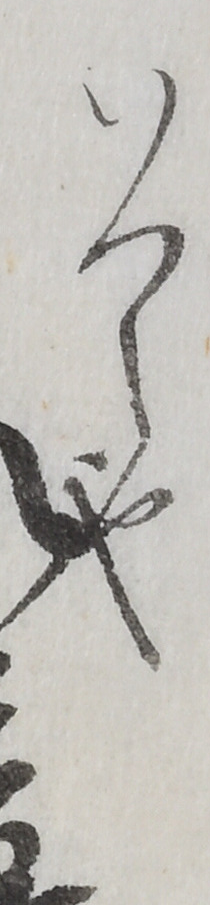いつゝや
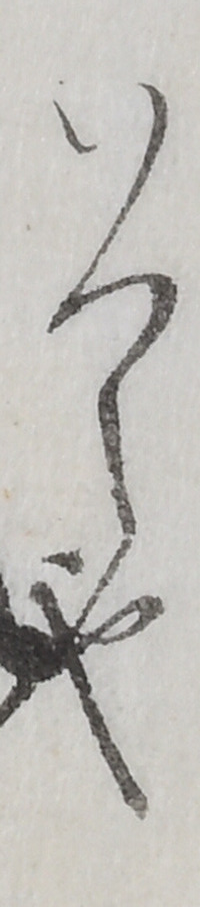いつゝや
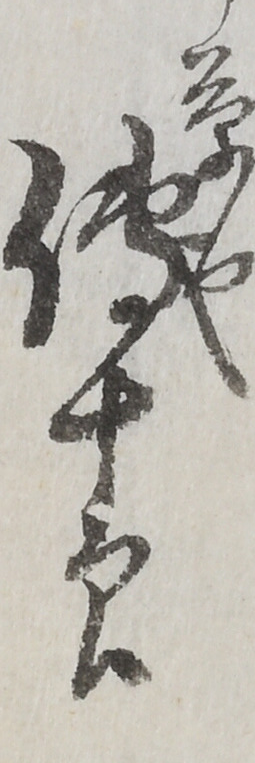伝十郎
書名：當町火消道具幷役附帳
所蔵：伊那市立高遠町図書館・合同会社AMANE
